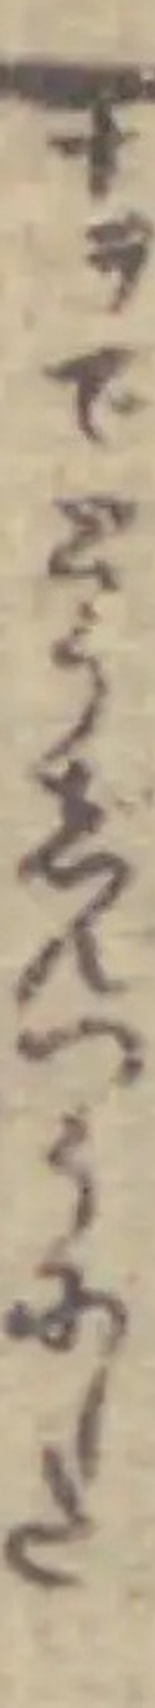十ヲでとうじんつうにした
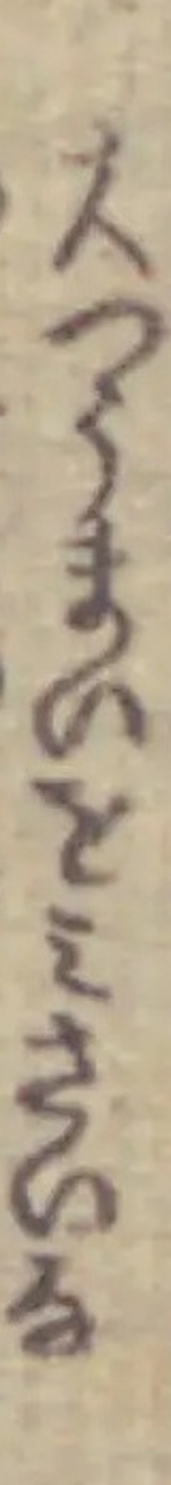大つうまいをみさいな
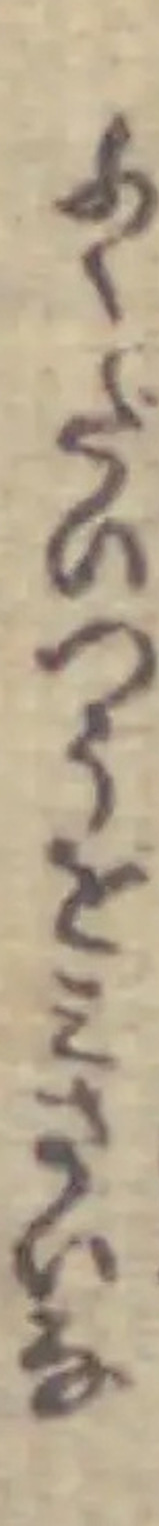よくだいつうをみさいな
